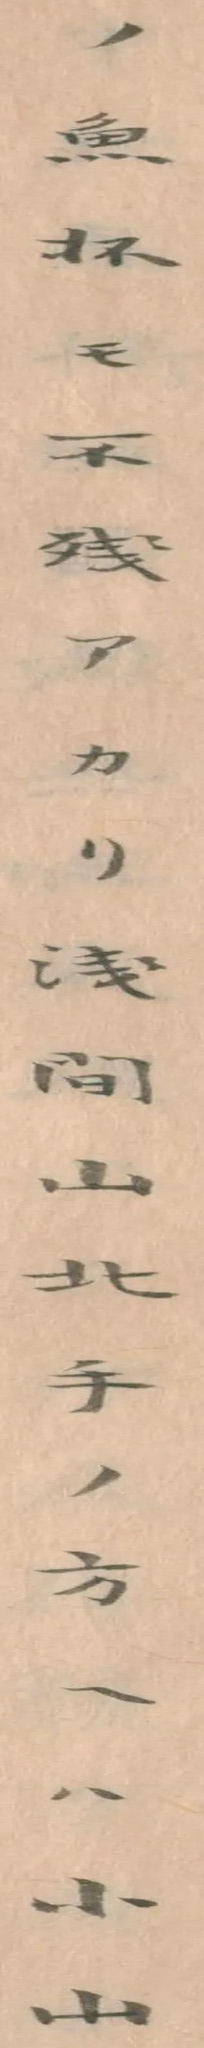ノ魚抔モ不残アカリ浅間山北手ノ方ヘハ小山
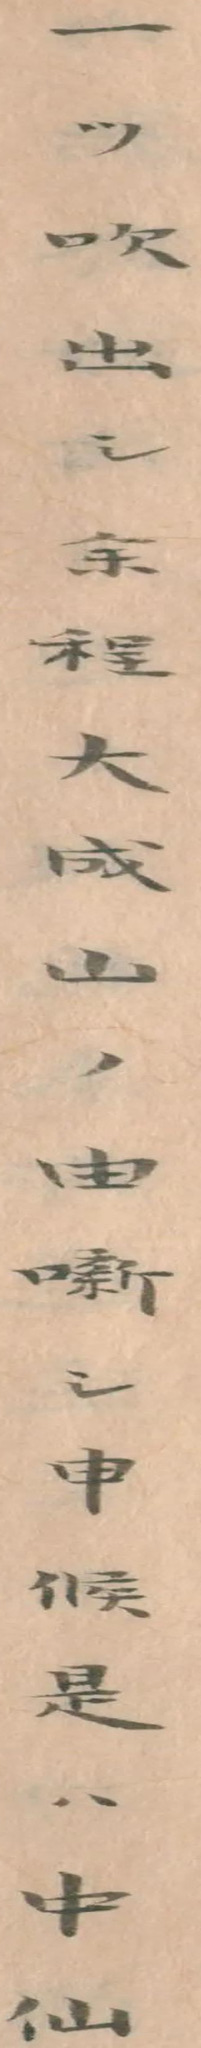一ツ吹出シ余程大成山ノ由噺シ申候是ハ中仙
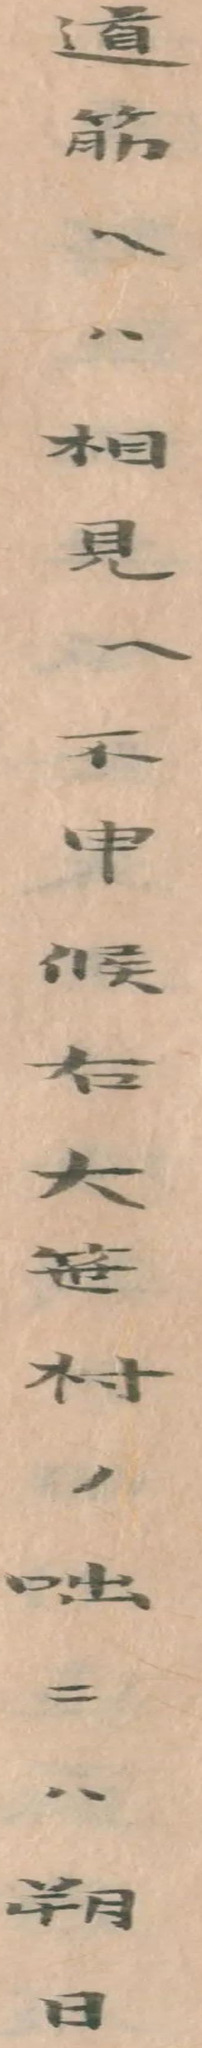道筋ヘハ相見へ不申候右大笹村ノ咄ニハ朔日
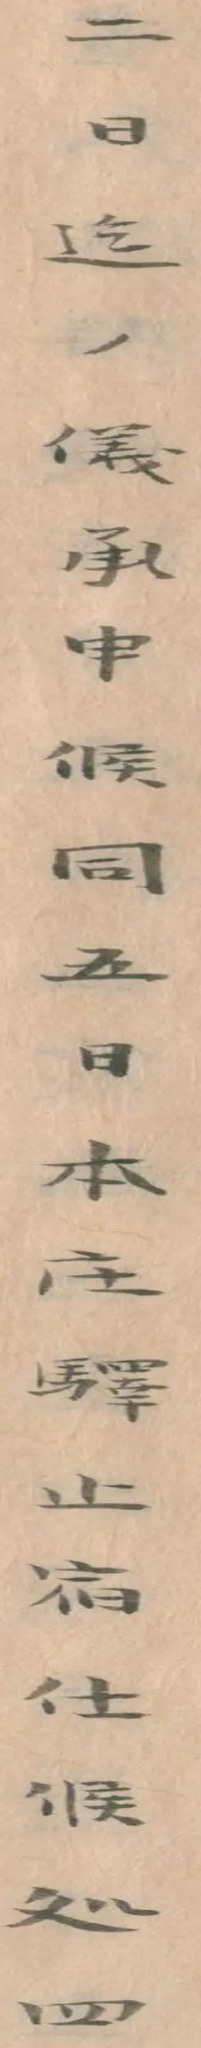二日迄ノ儀承申候同五日本庄驛止宿仕候処四
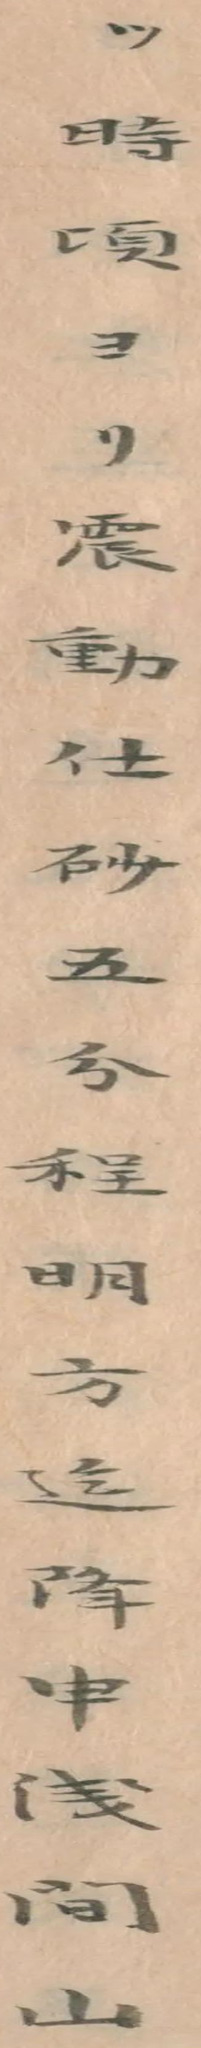ツ時頃ヨリ震動仕砂五分程明方迄降申浅間山

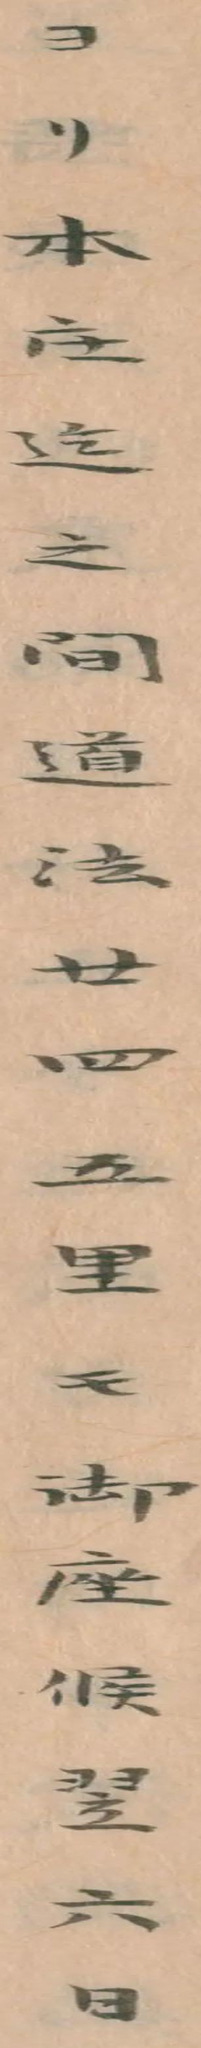ヨリ本庄迄之間道法廿四五里モ御座候翌六日
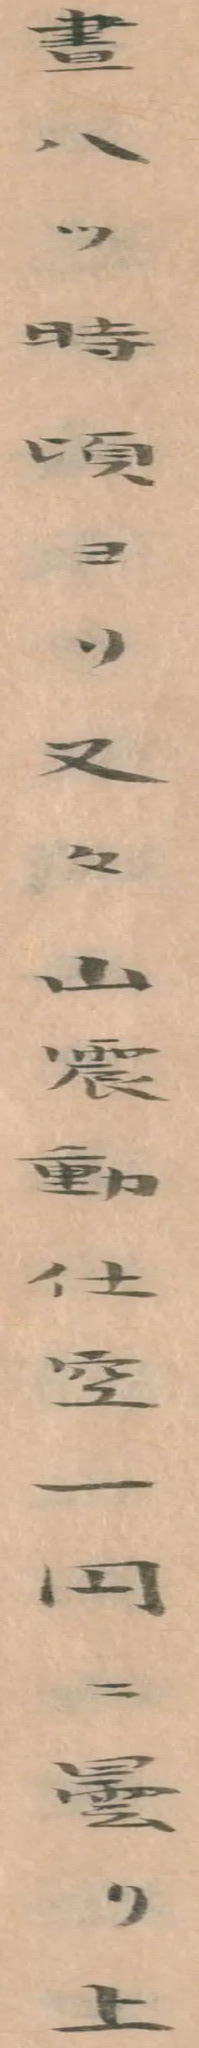晝八ッ時頃ヨリ又々山震動仕空一面二曇り上
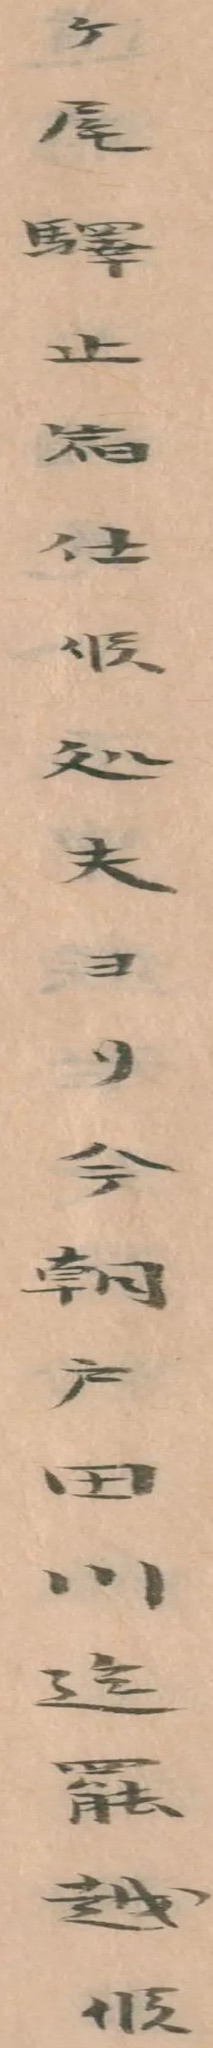ケ尾驛止宿仕候処夫ヨリ今朝戸田川迄罷越候
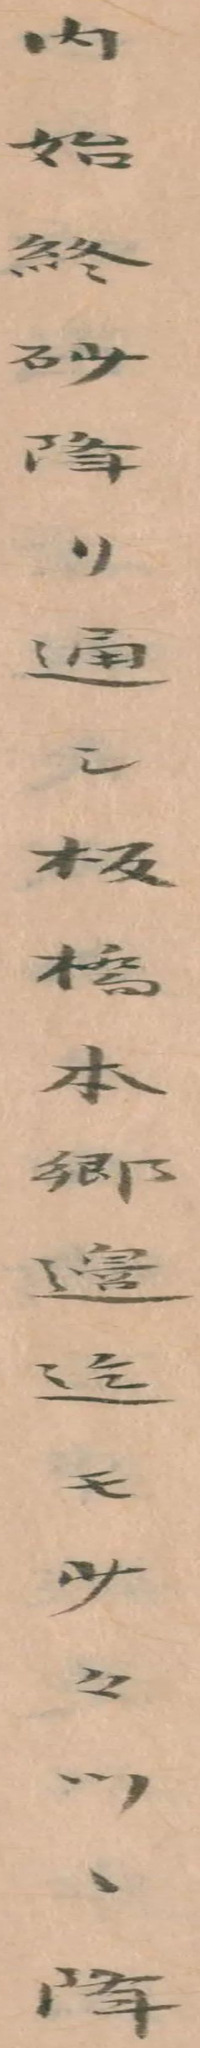内始終砂降り通シ板橋本郷辺迄モ少々ツゝ降
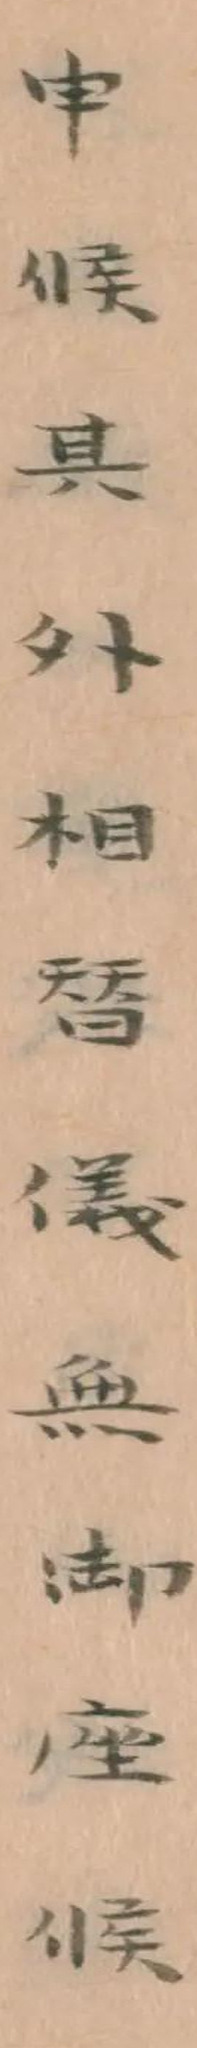申候其外相替儀無御座候
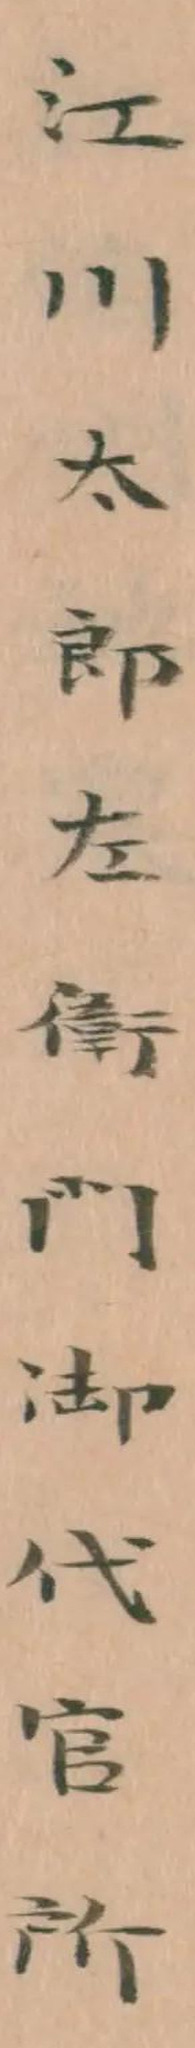江川太郎左衛門御代官所
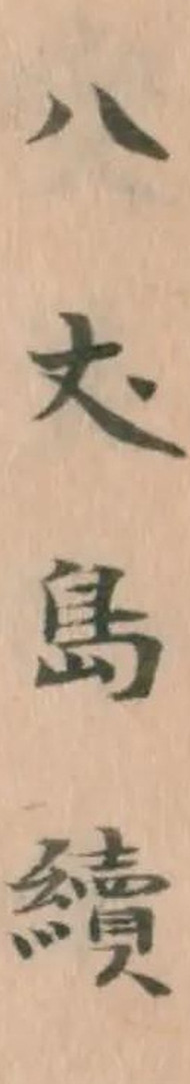八丈島続
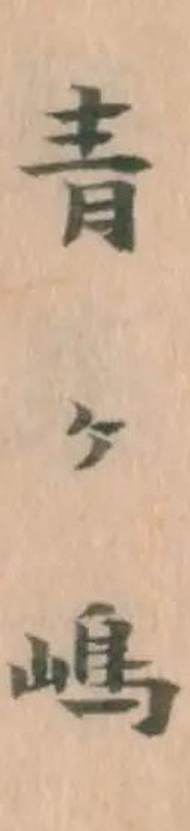青ケ嶋
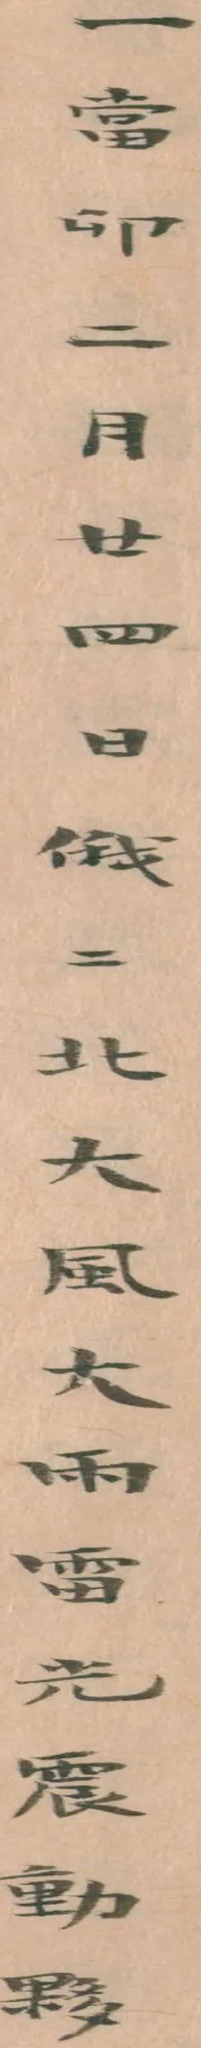当卯二月廿四日俄二北大風大雨雷光震動夥
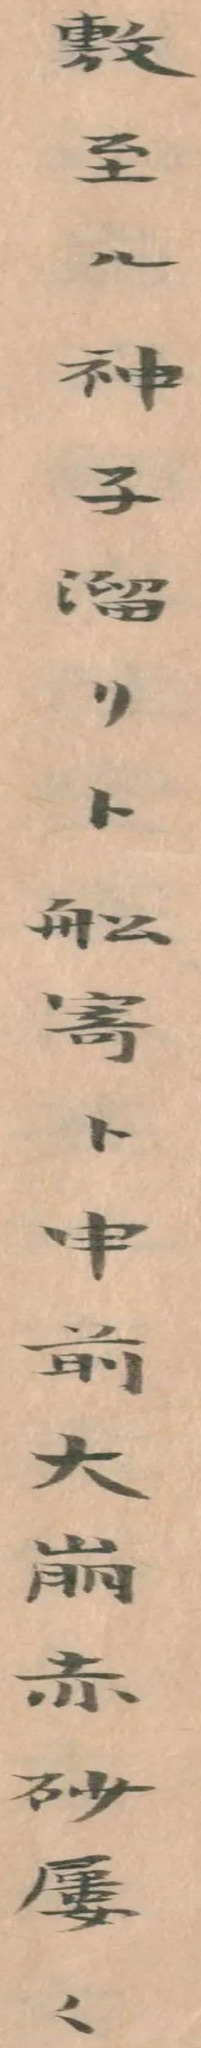敷至ル神子溜リト船寄ト申前大崩赤砂屡々
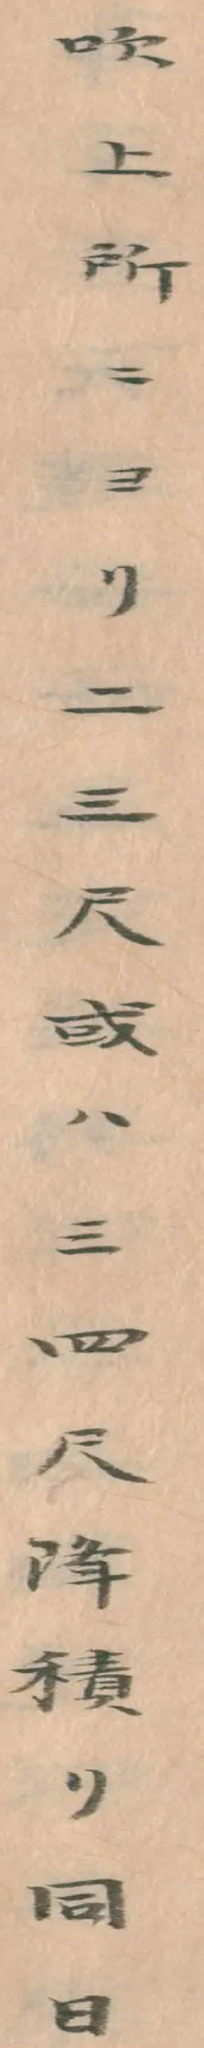吹上所二ヨリ二三尺或ハ三四尺降積り同日
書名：地災撮要. 巻1(噴火山・地震ノ部)
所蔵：国立国会図書館 National Diet Library, JAPAN
